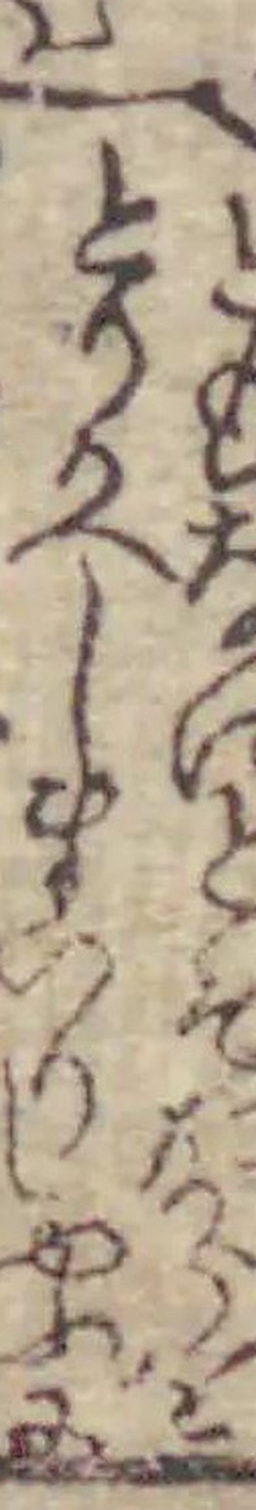とりかへしまいりしやふに
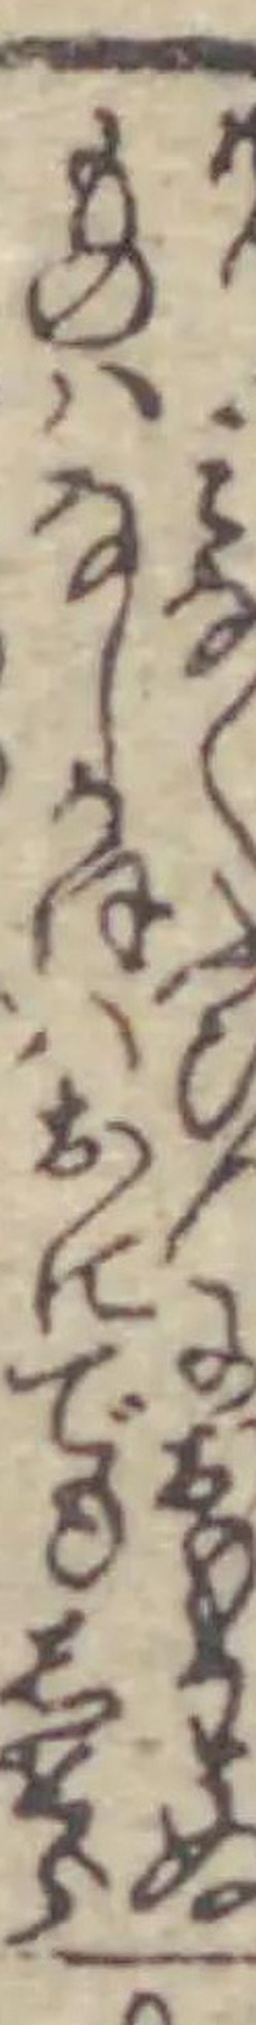ものはなしかほはおにでもしをら
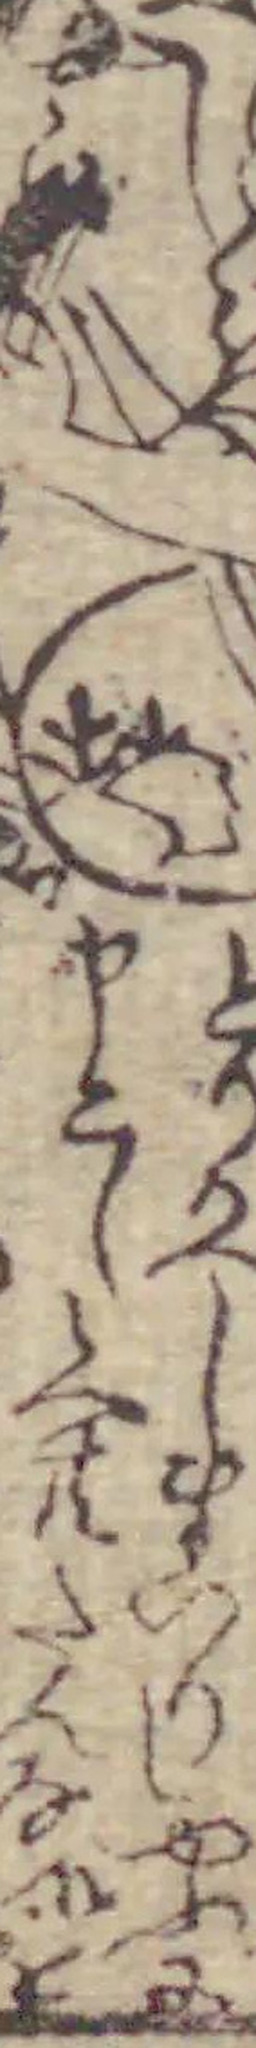申こし候へ共たんな様を
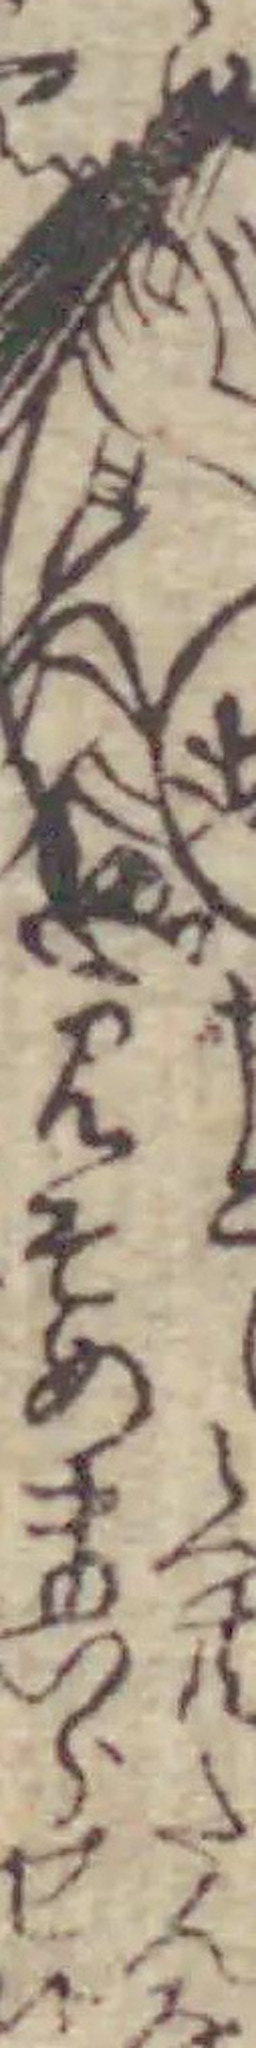見そめまいらせ候お
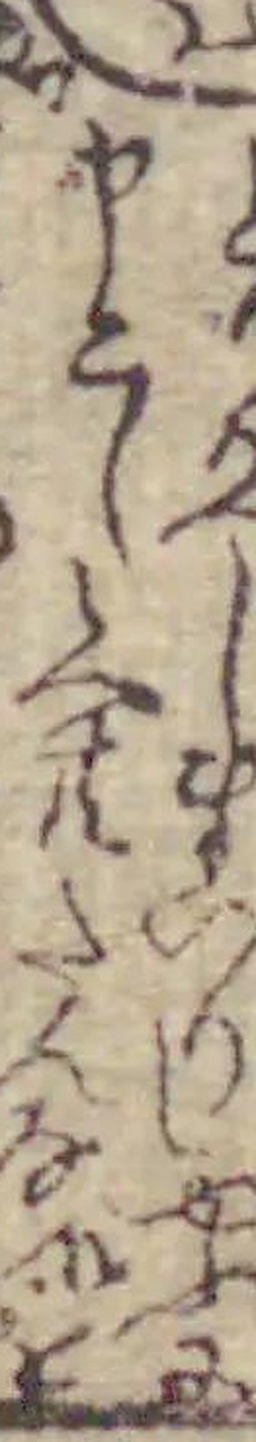申こし候へ共たんな様を
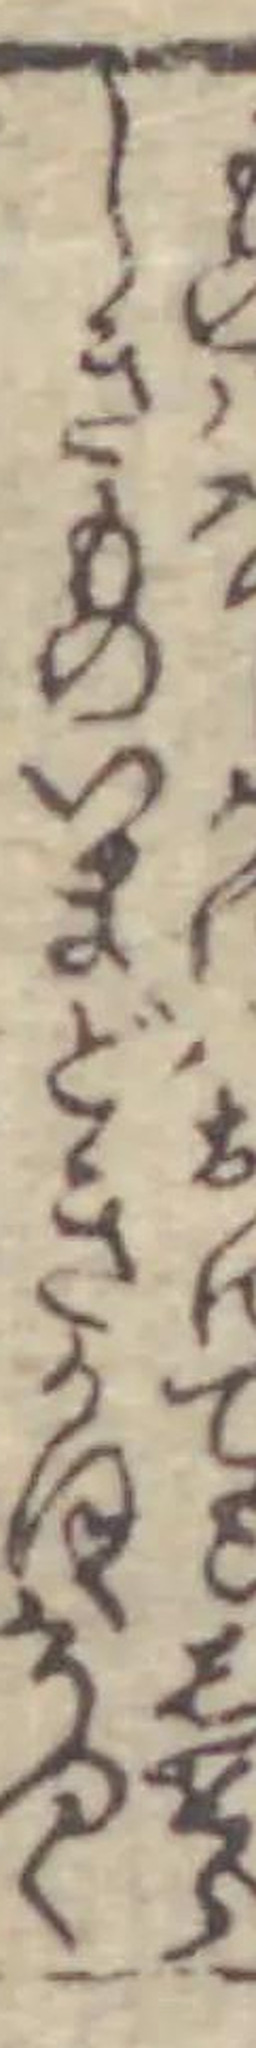しきものいまどきかほはうつく
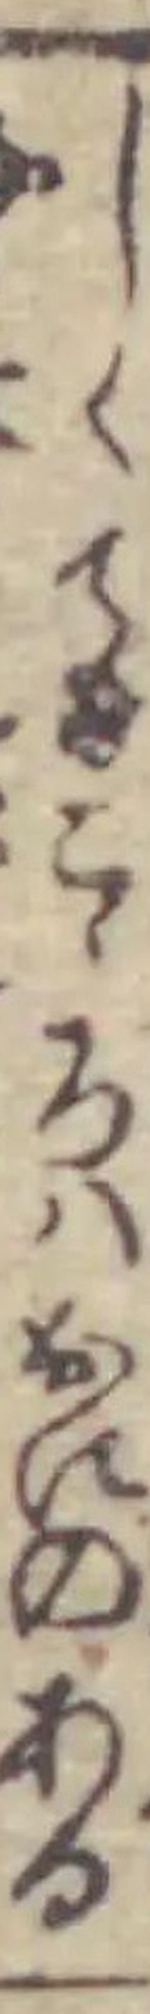しくてもこゝろはおにのある
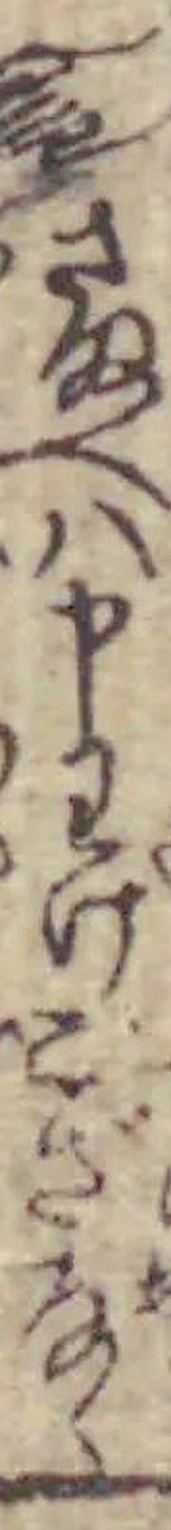さまへは申わけござなく
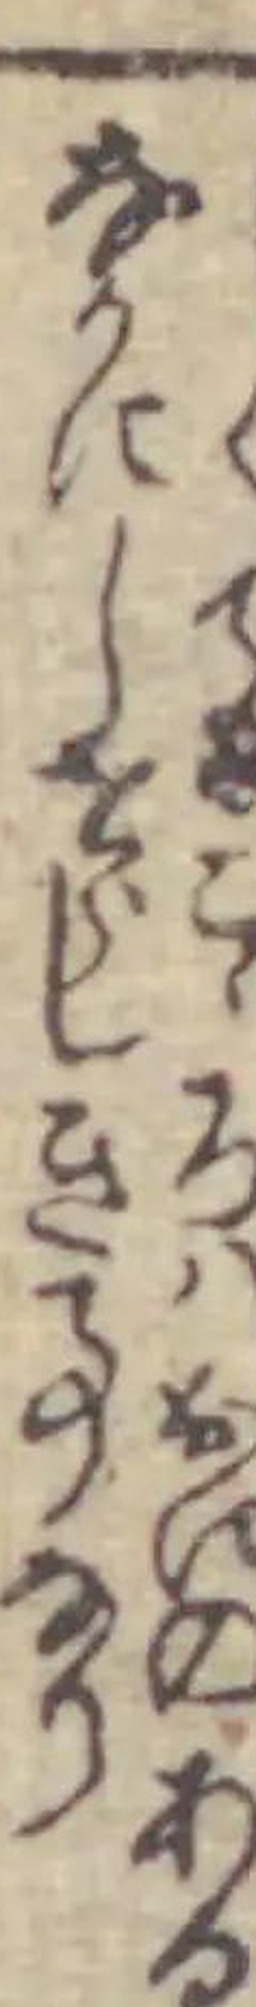なかにしをらしき事なり
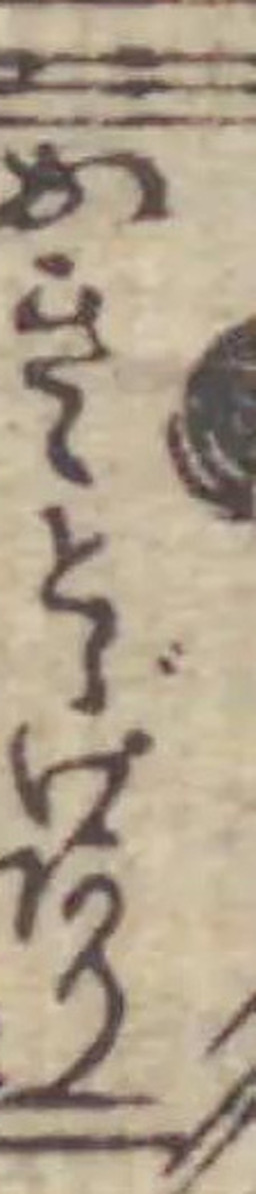おきゝとゞけあり
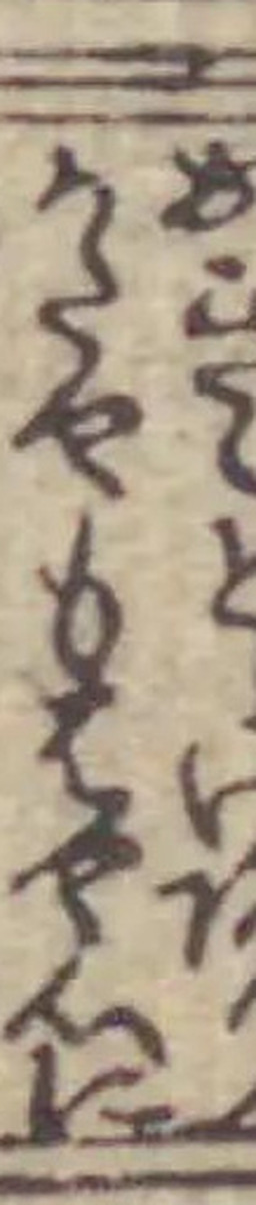かたやもはや心に
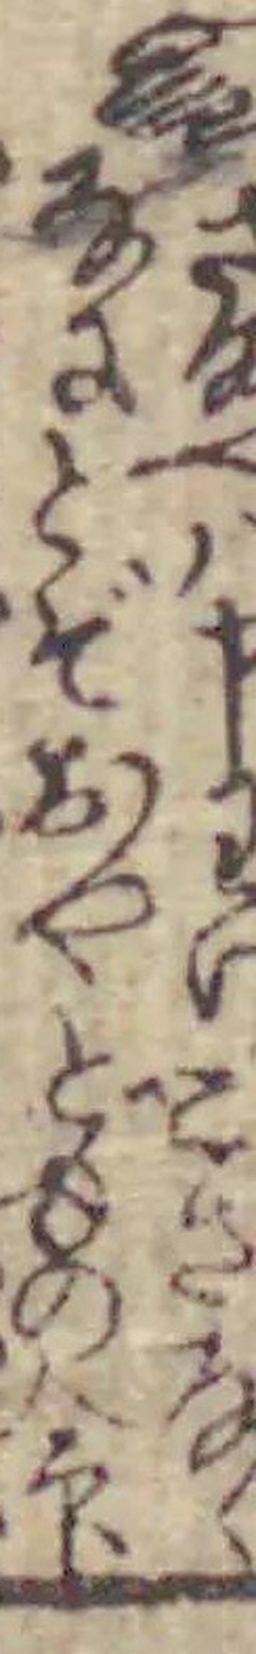なにとぞおやどもの命
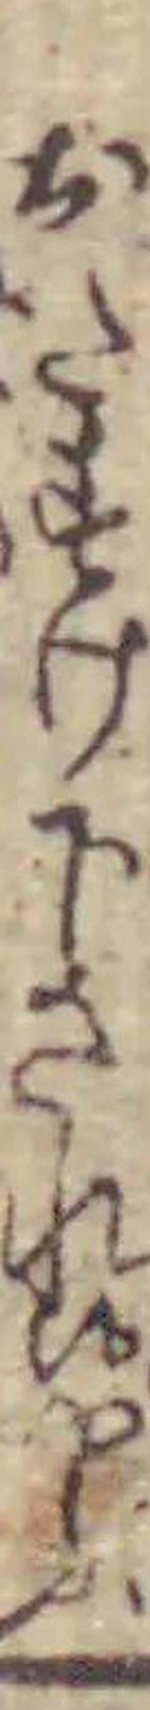おたすけ下され候やふ
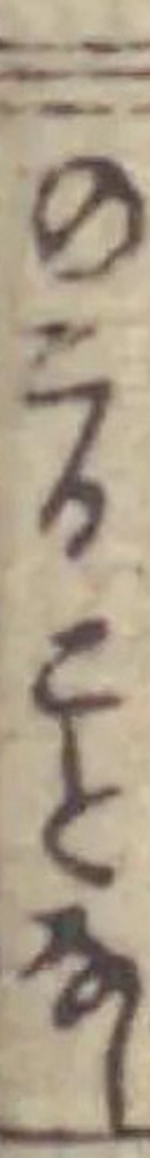のこることなし
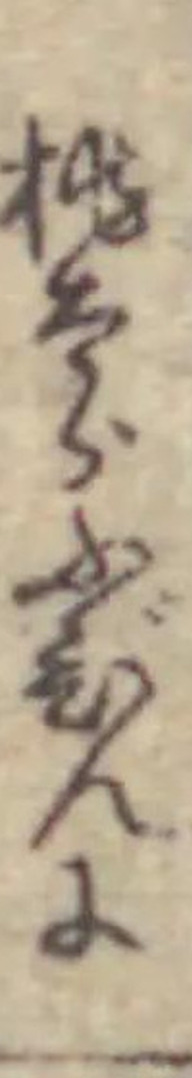桃太郎ふびんに
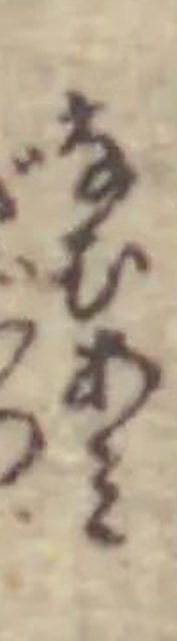なむあみ
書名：桃太郎元服姿 2巻
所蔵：国立国会図書館 National Diet Library, JAPAN
